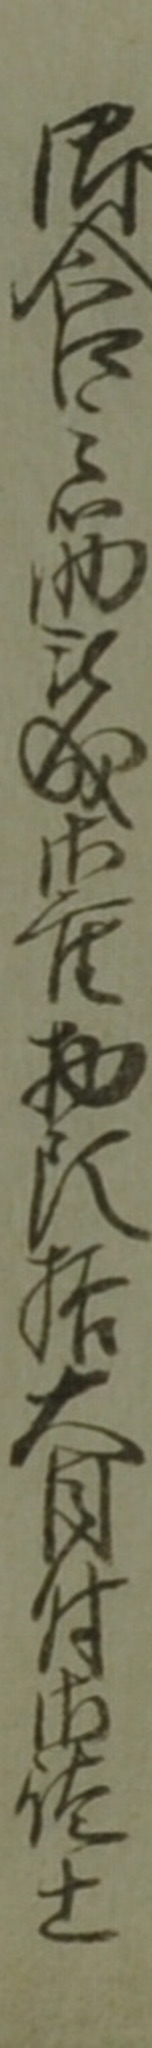御含之筋被成御座物頭格大目付御徒士
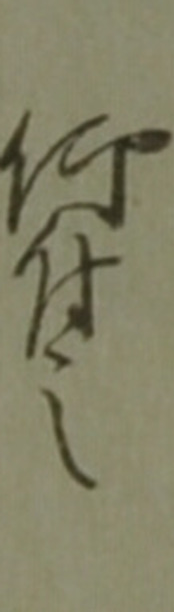仰付之
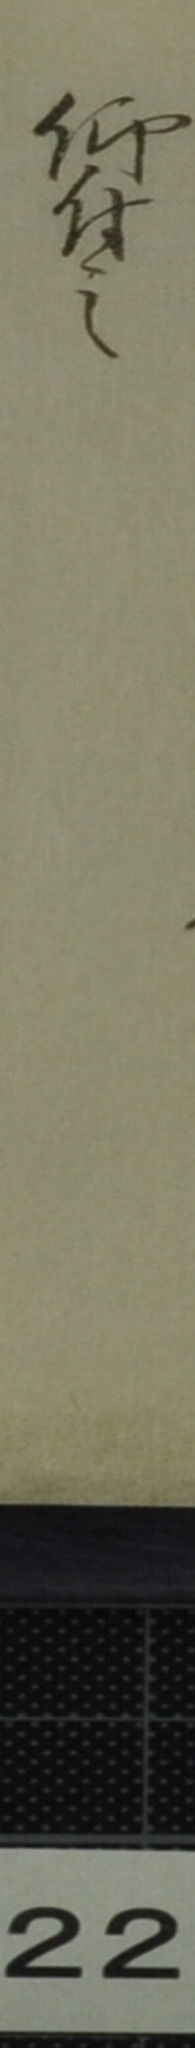仰付之
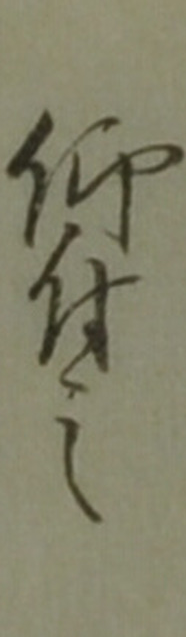仰付之
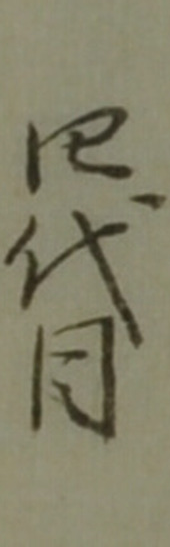四代目
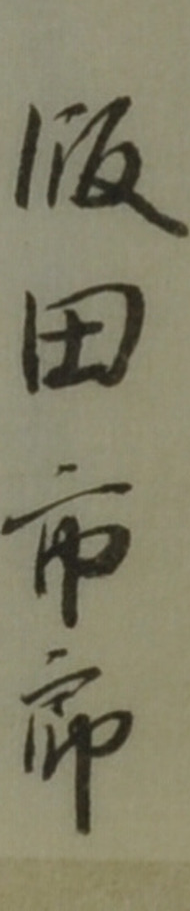飯田市郎
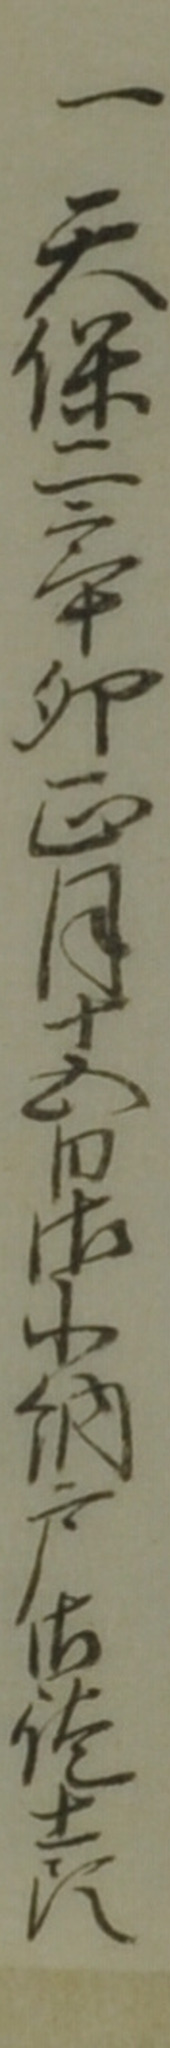一天保二辛卯正月十五日御小納戸御徒士頭
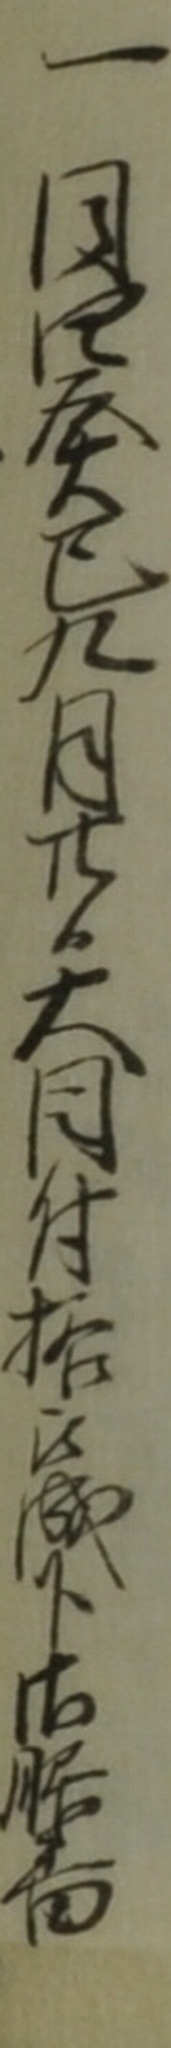一同四癸巳九月廿日大目付格被成下御膳番
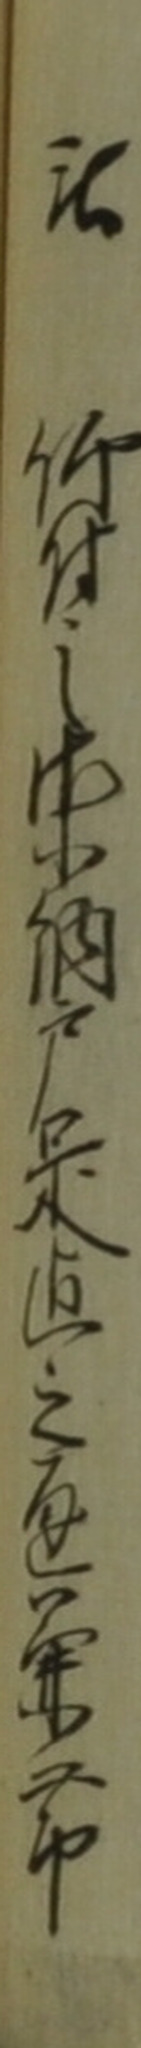被仰付之御小納戸是迄之通兼帯
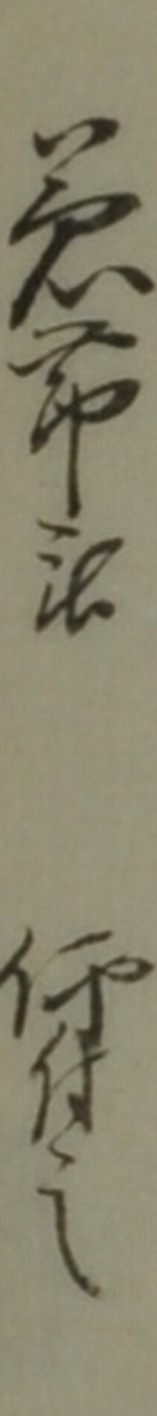兼帯被仰付之
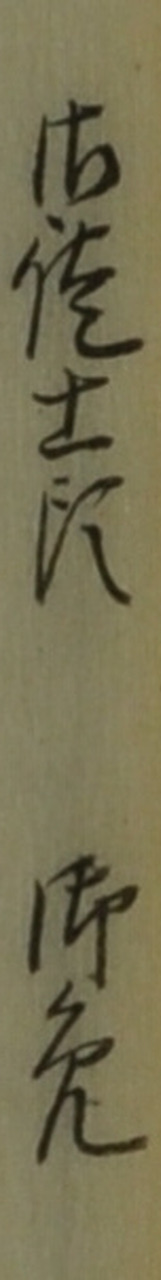御徒士頭御免
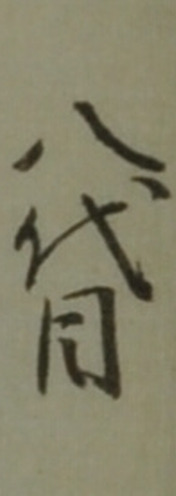八代目
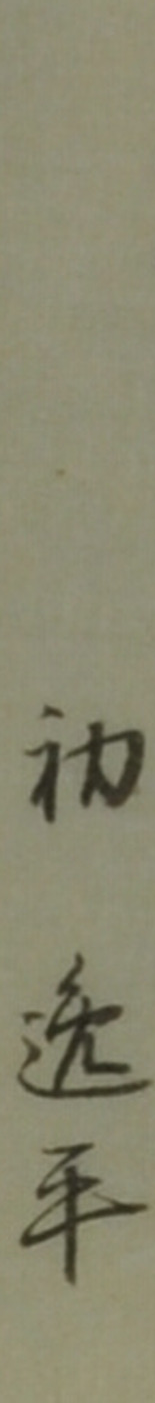初逸平
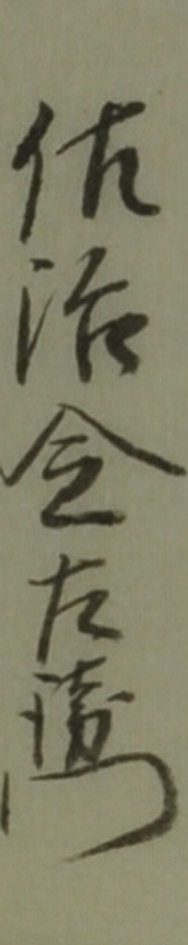佐治金左衛門
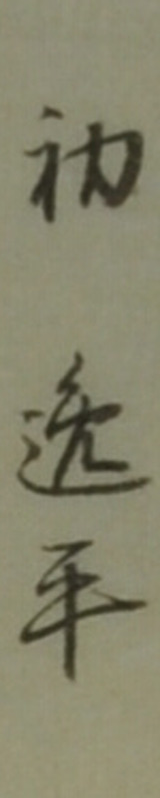初逸平
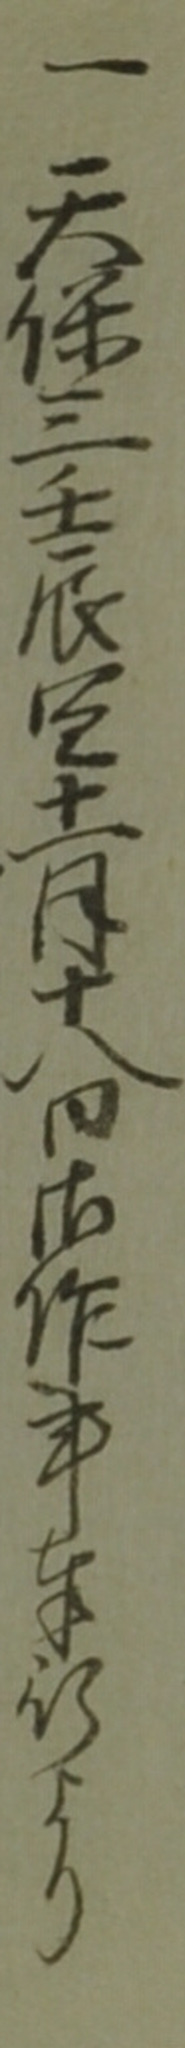一天保三壬辰閏十一月十八日御作事奉行より
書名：諸御役代々録（六）
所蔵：伊那市立高遠町図書館・合同会社AMANE
